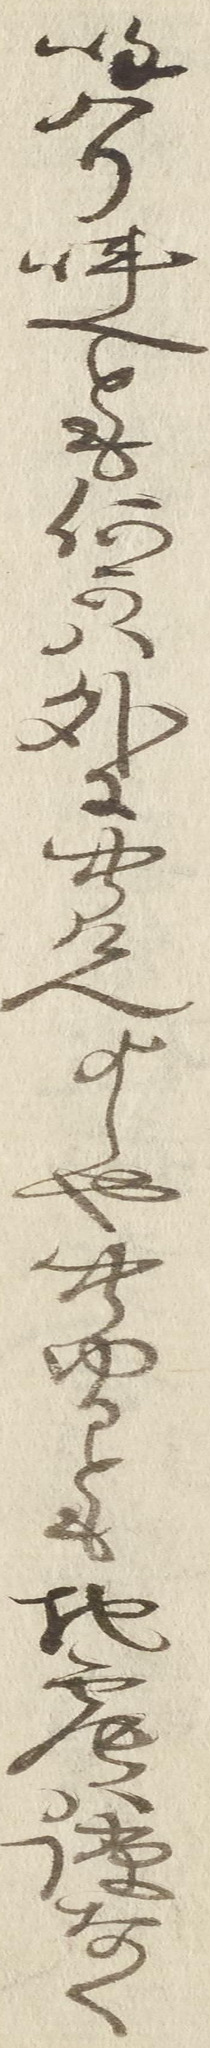呼けり呼へとも何かハ外に聞けんよしや聞ゆるとも地震ハ隙なく
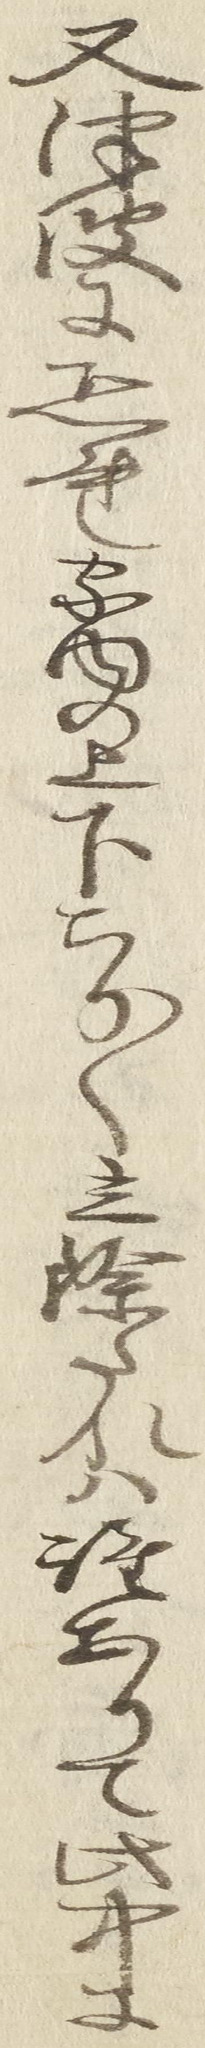又津波に恐れ家内の上下ちり〳〵立除たれハ誰ありて此中に
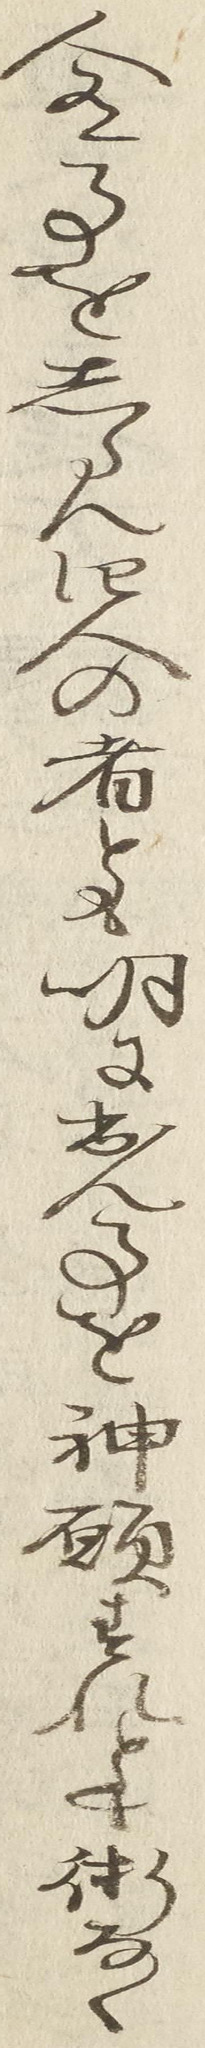人有事をしらん四人の者とも明に出ん事を神願すれとも術なく
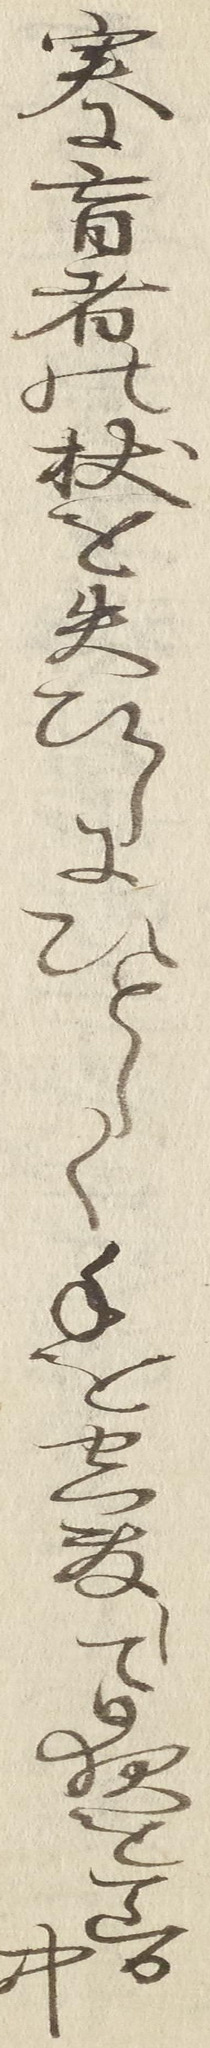実に盲者の杖を失ひしにひとしく手を空敷して日夜を送る中
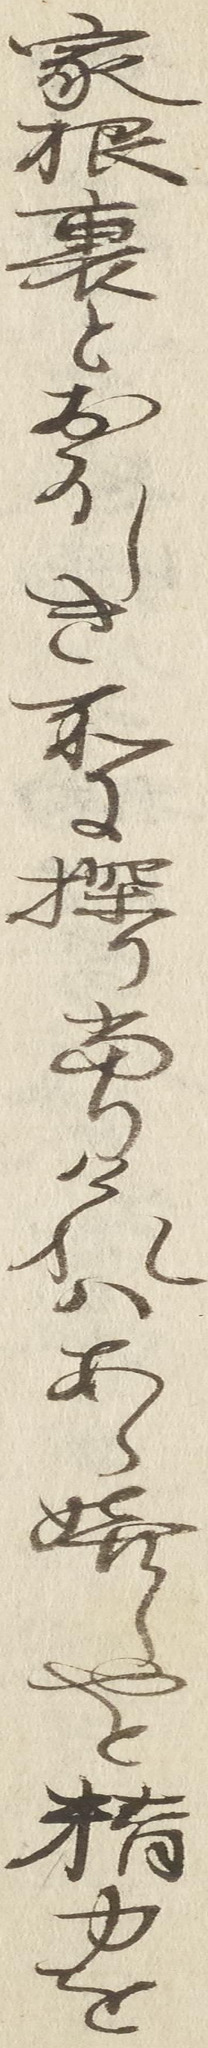家根裏とおほしき所に探り當りけれハあら嬉しやと精力を
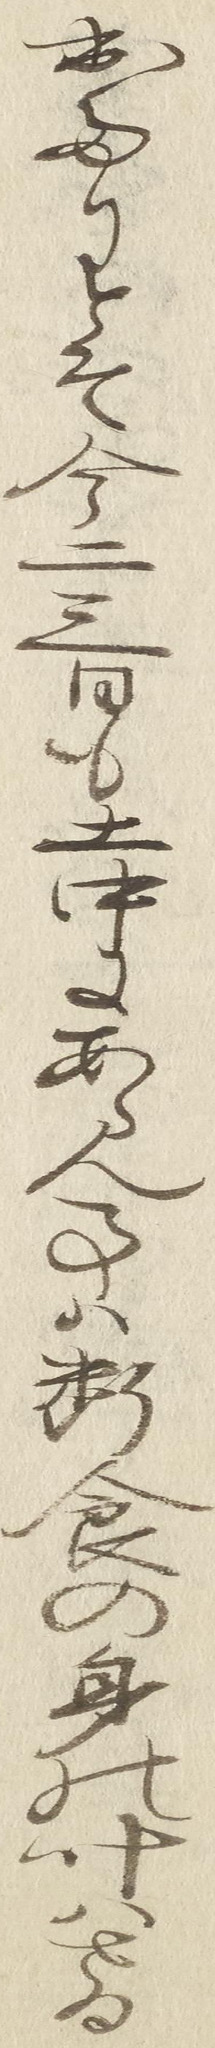出たりとそ今二三日も土中にあらん事ハ断食の身叶ハさる
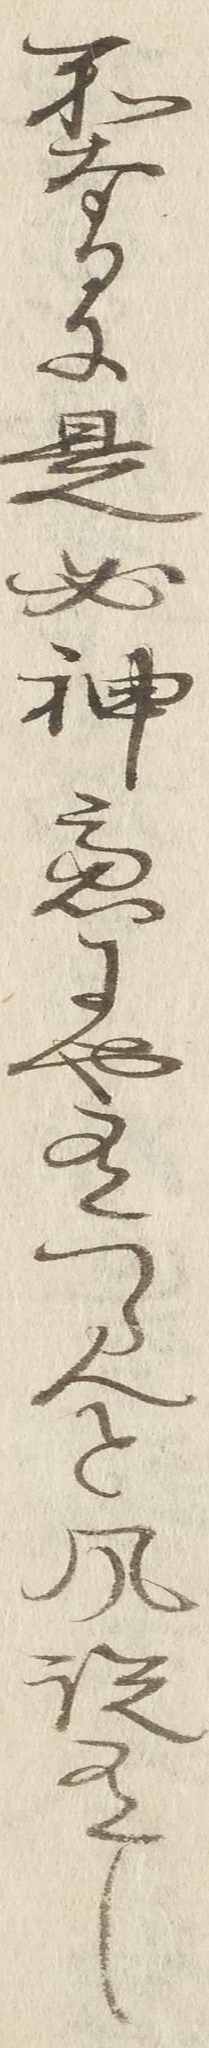所なるに是必神慮にや有つらんと風説有し
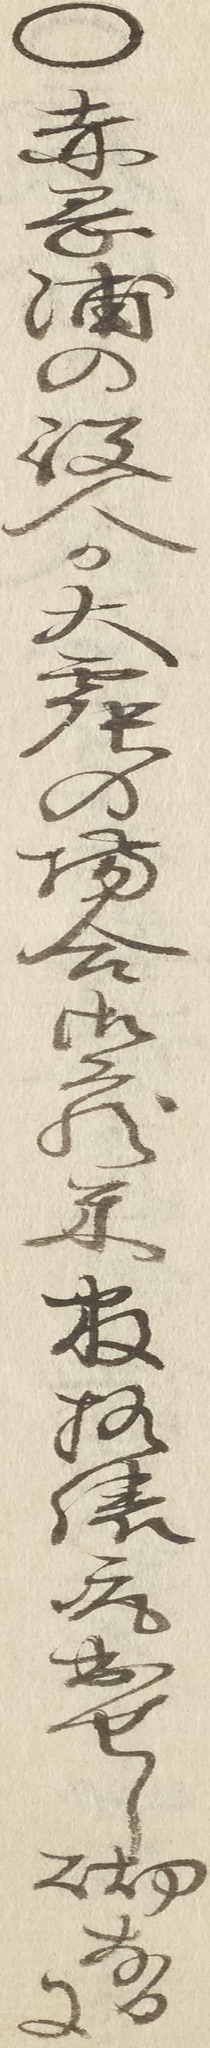○赤岡浦の役人か大震の場合御蔵米数拾俵取出せし砌なるに
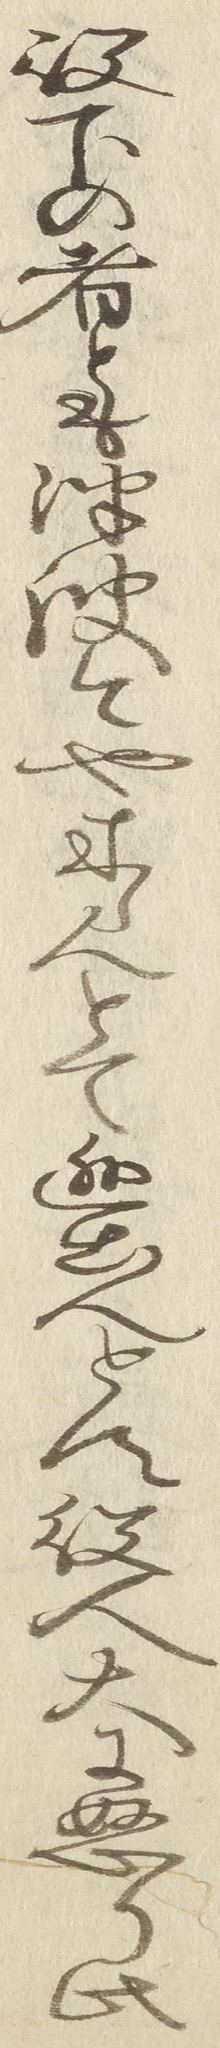役下の者とも津波とや来らんとて逃出んとす役人大に怒り此
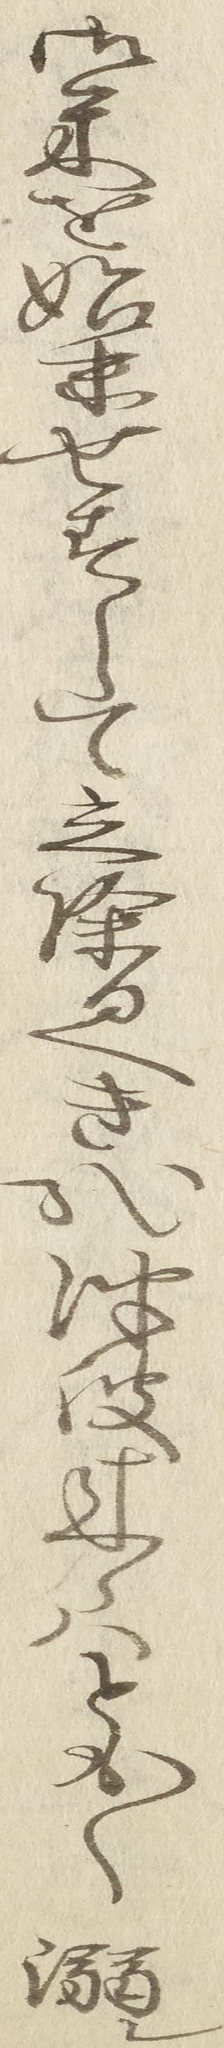御米を始末せすして立除るへきか津波来らハとかく溺れレ
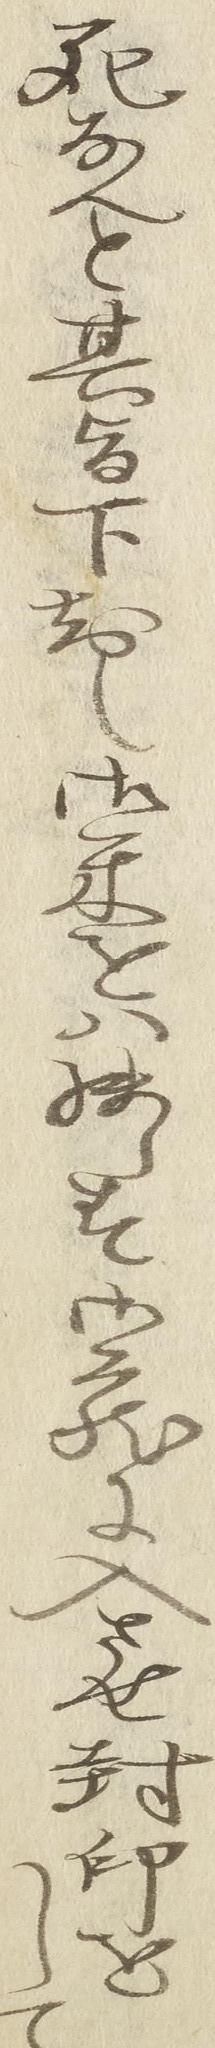死なんと其旨下知し御米をハ残らす御蔵に入させ封印をして

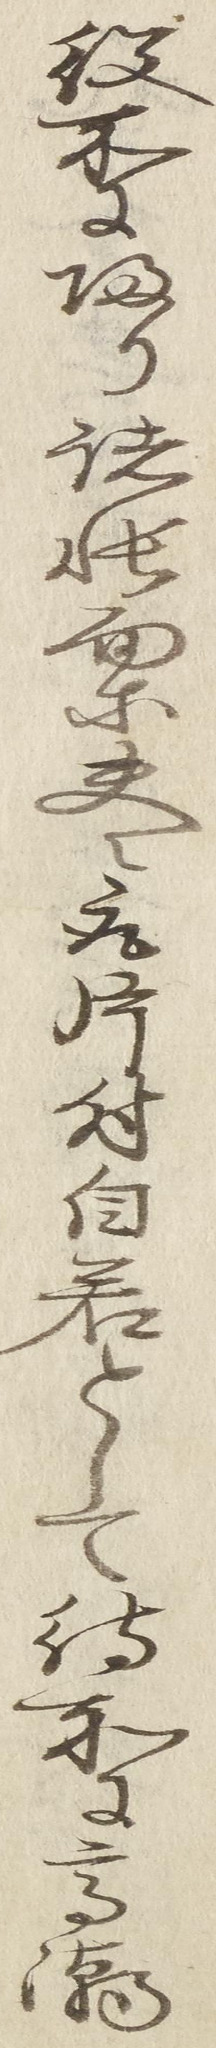役所に帰り諸帳面等夫々取片付自若として待所に高潮
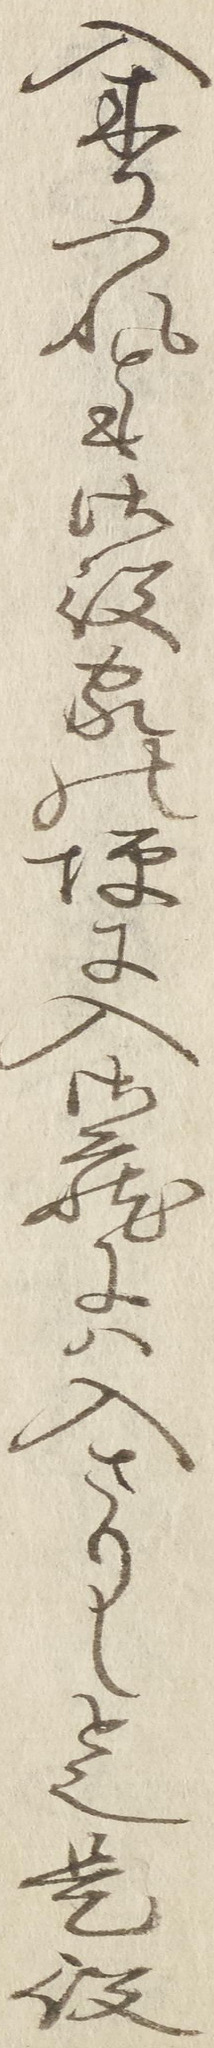入来りつれとも御役家の隙に入御蔵には入さりしと也是役
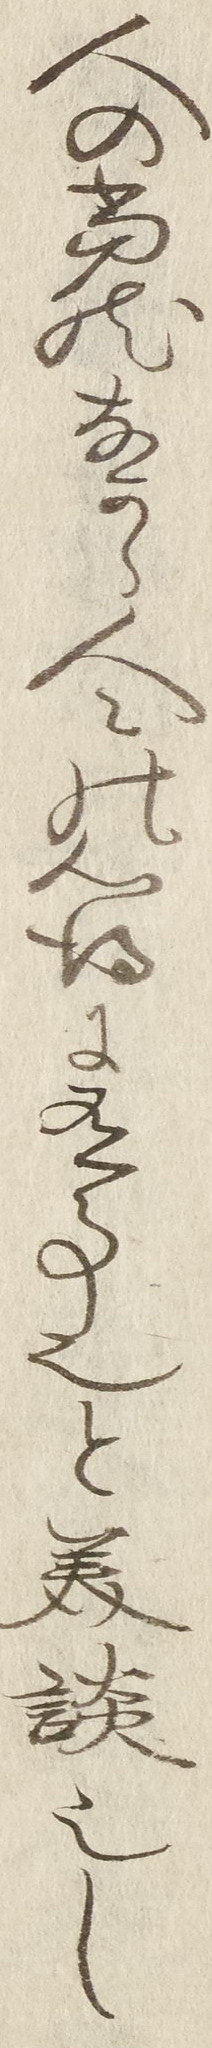人の当然なから人々の心得に有事也と美談也し
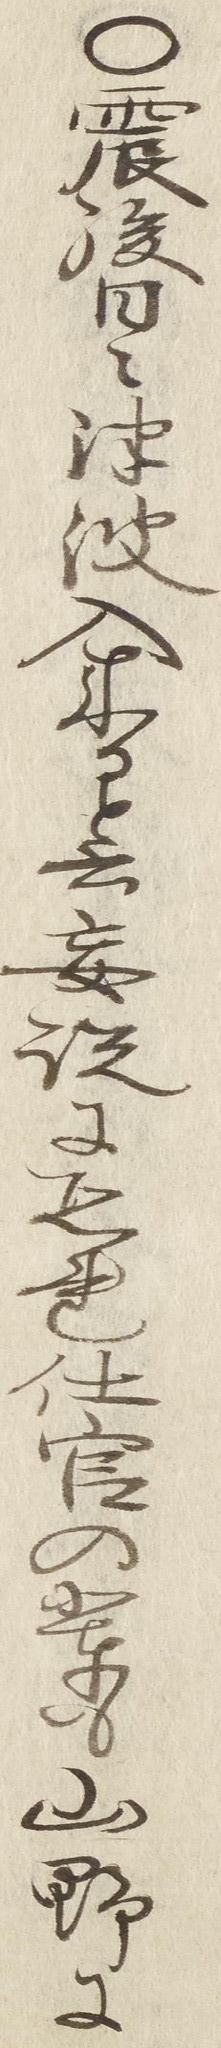○震後日々津波入来ると云妄説に恐れ仕官の輩も山野に
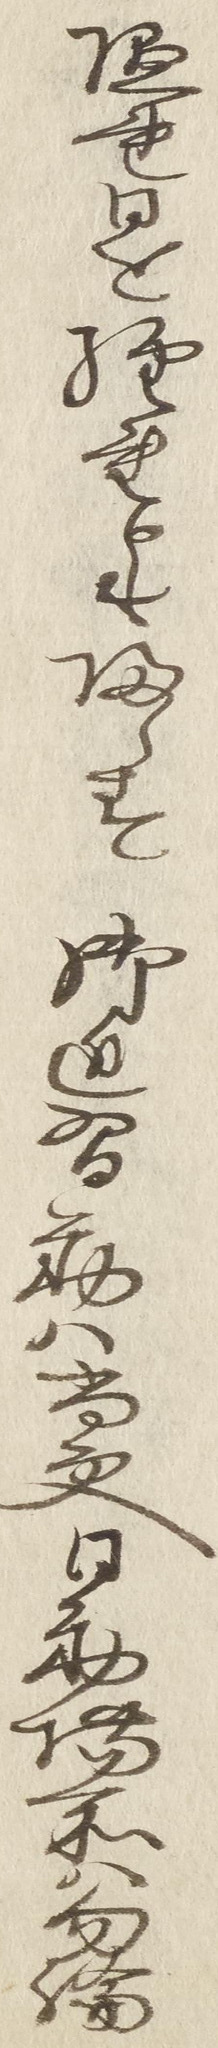隠れ日を経れとも帰らす御近習勤は尚更日勤場所は勿論
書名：地震記　上
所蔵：東京大学地震研究所図書室 Earthquake Research Institute Library, The University of Tokyo, JAPAN
